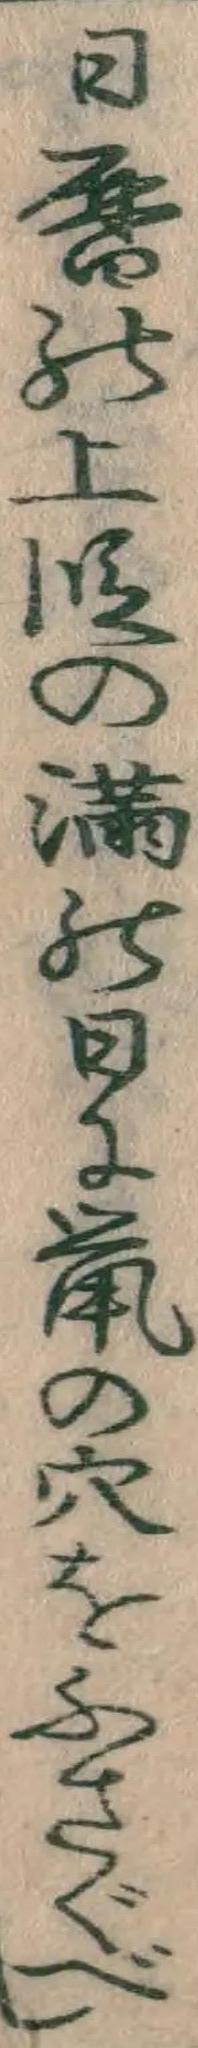日暦の上段の満の日に鼠の穴をふさぐべし
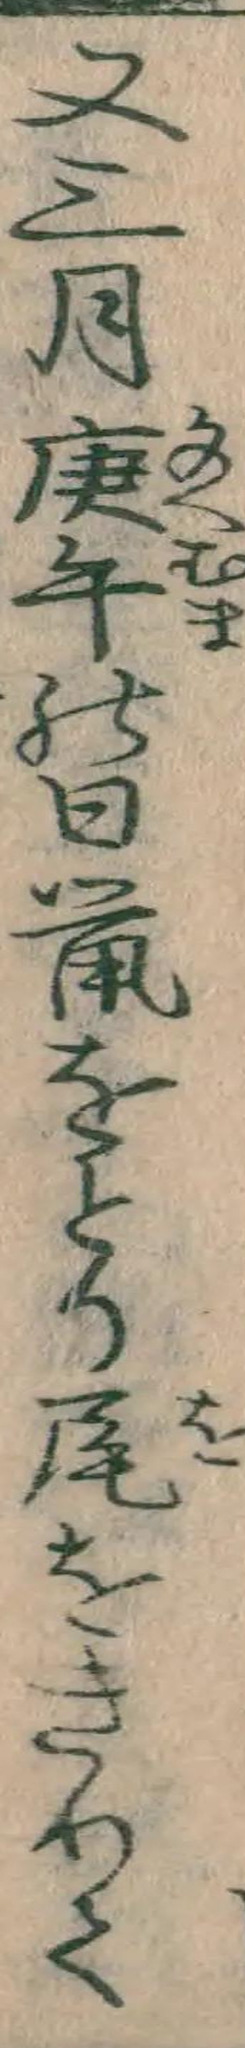又三月庚午の日鼠をとり尾をきりて
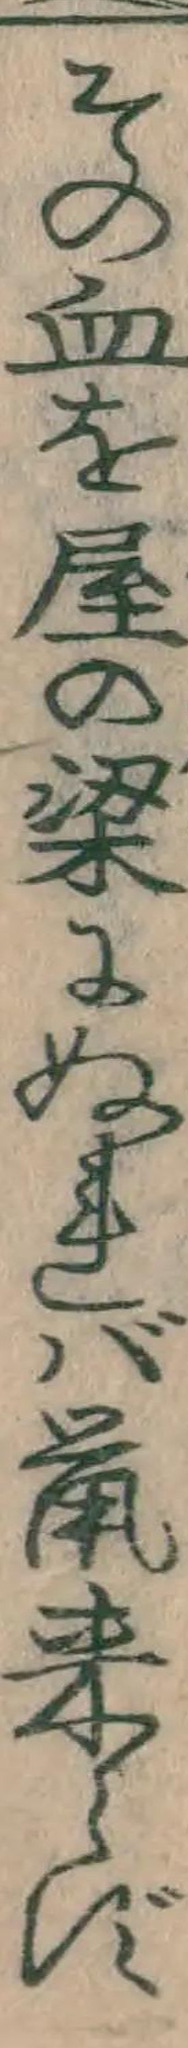その血を屋の梁にぬれば鼠来らず

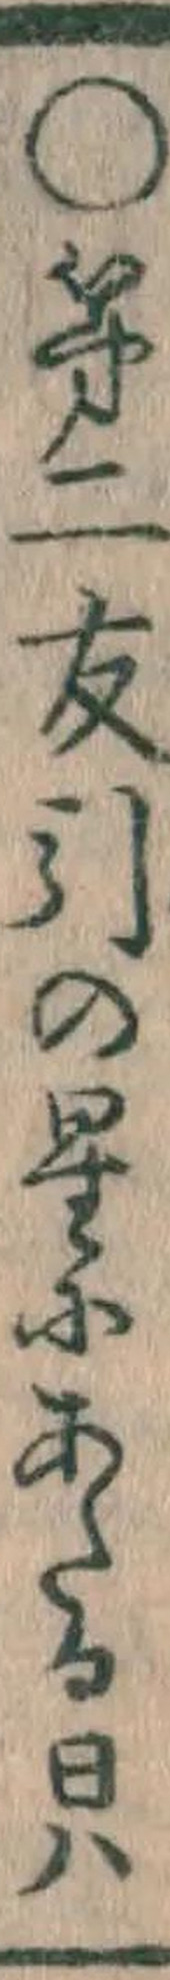○第二友引の星にあたる日は
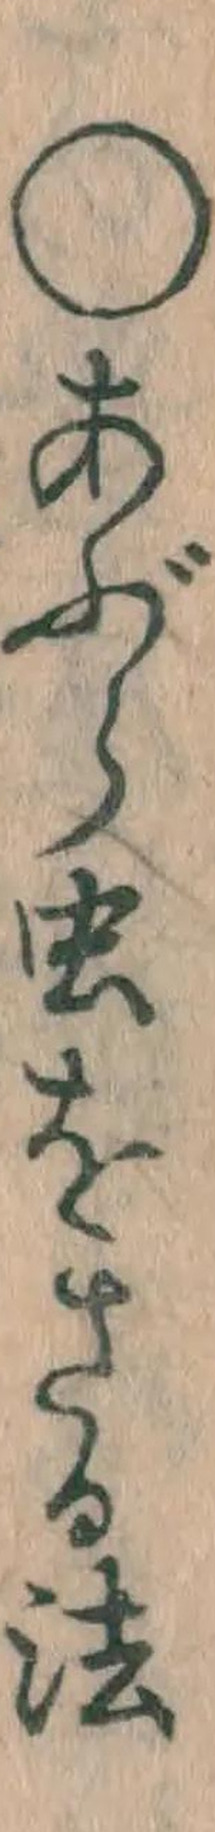○あぶら虫をさる法
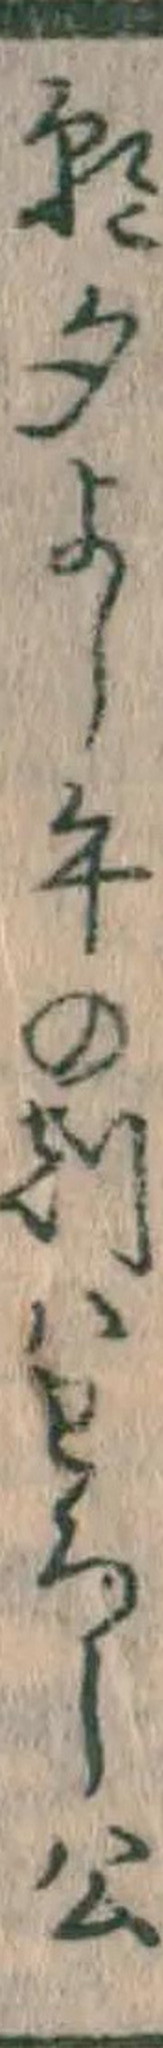朝夕よし午の刻はわろし公
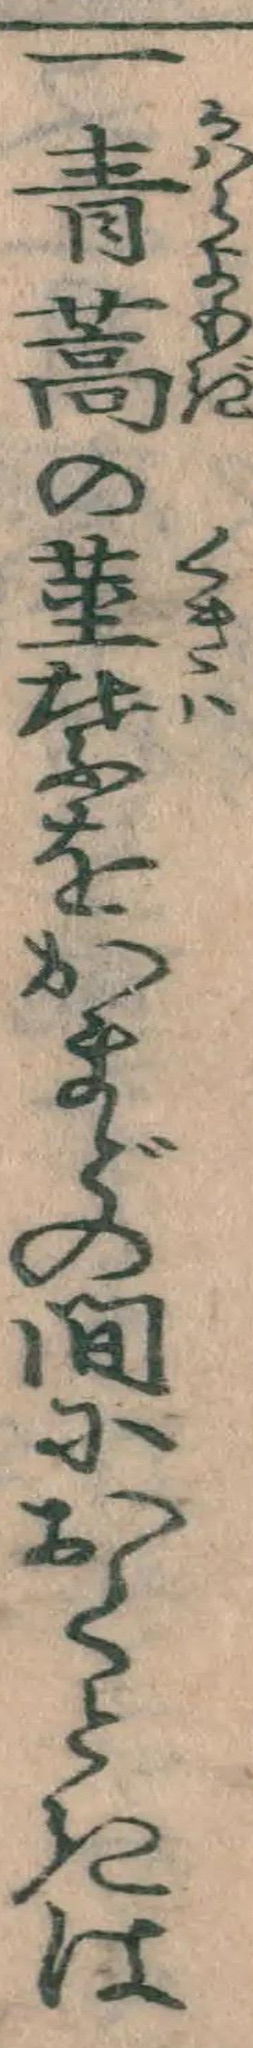一青蒿の茎葉をかまどの間におくときは
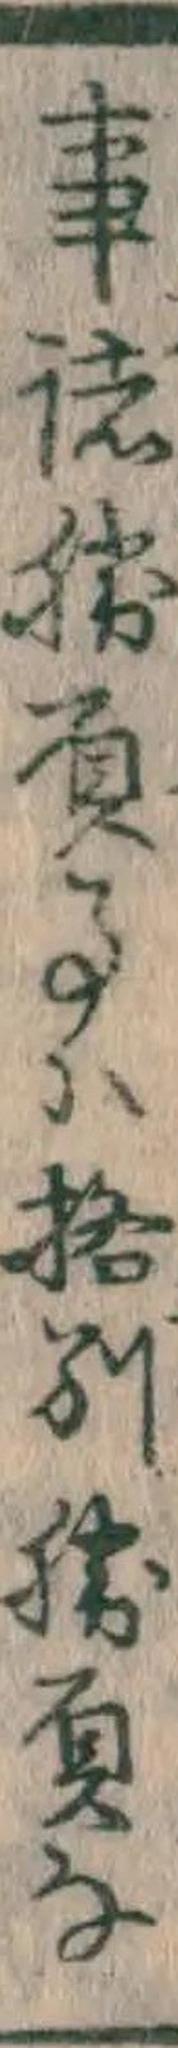事諸勝負事は格別勝負な
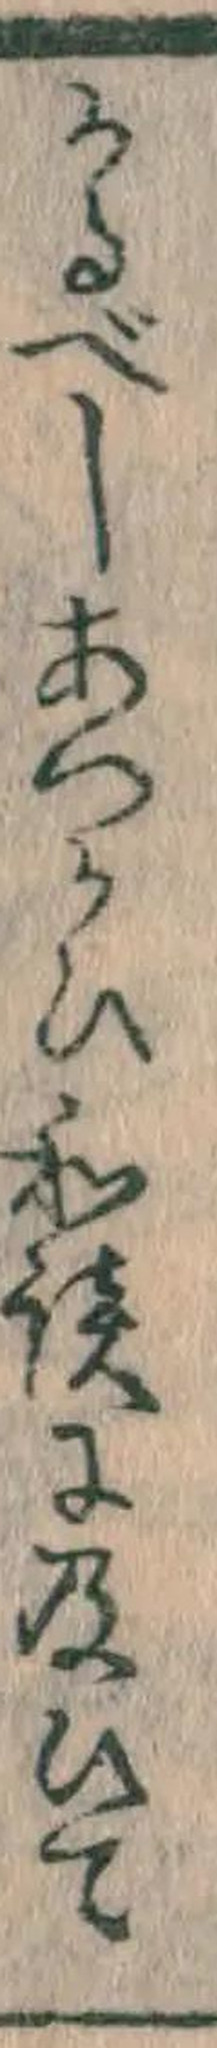かるべしあつかひ和談に及ひて
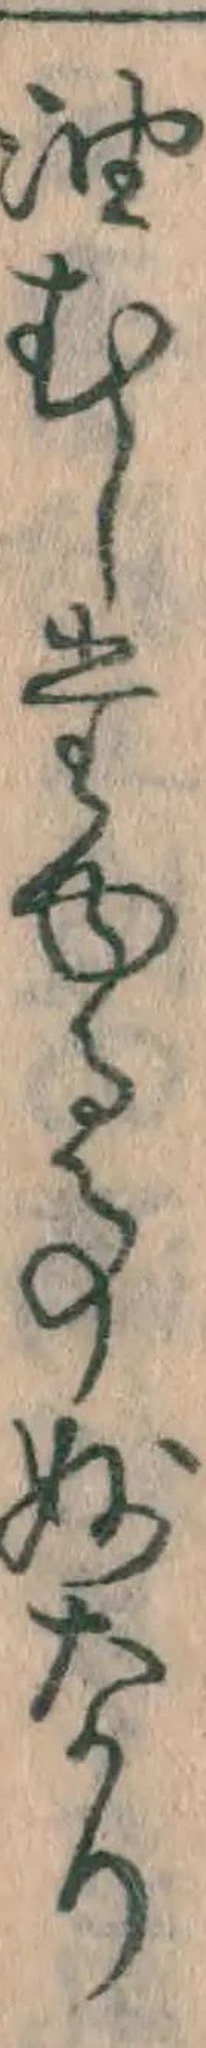油むしたゆる事妙なり
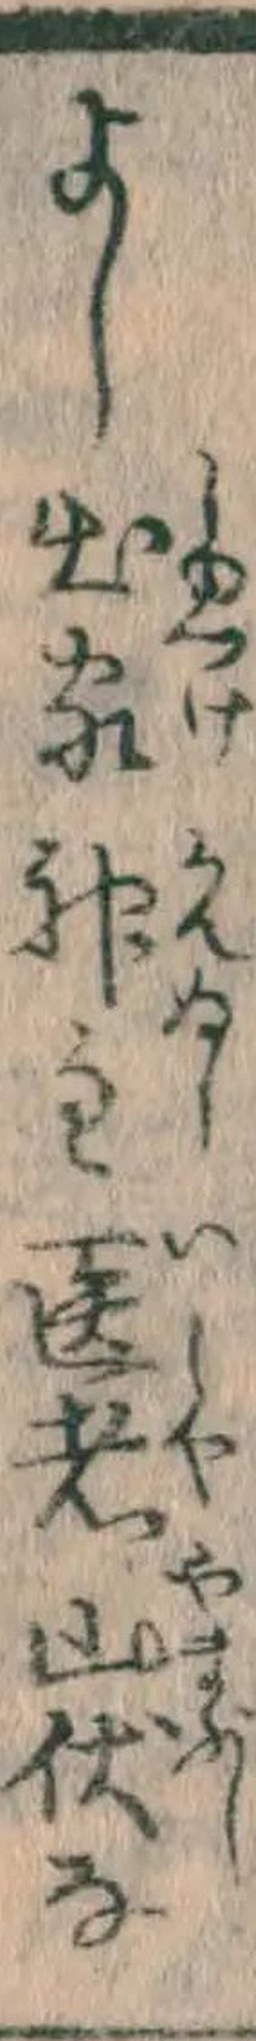よし出家神主医者山伏な
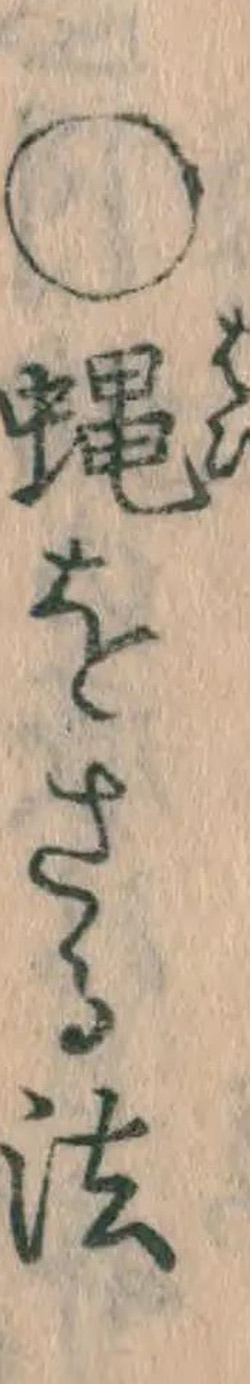○蝿をさる法
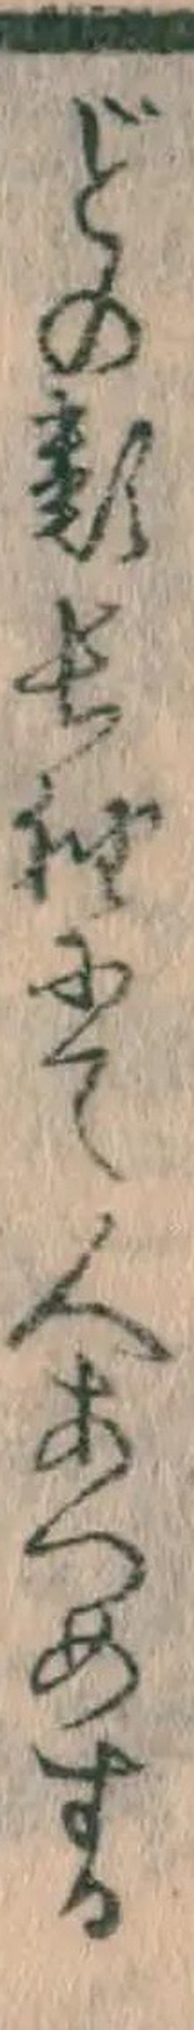どの類長袖にて人あつめする
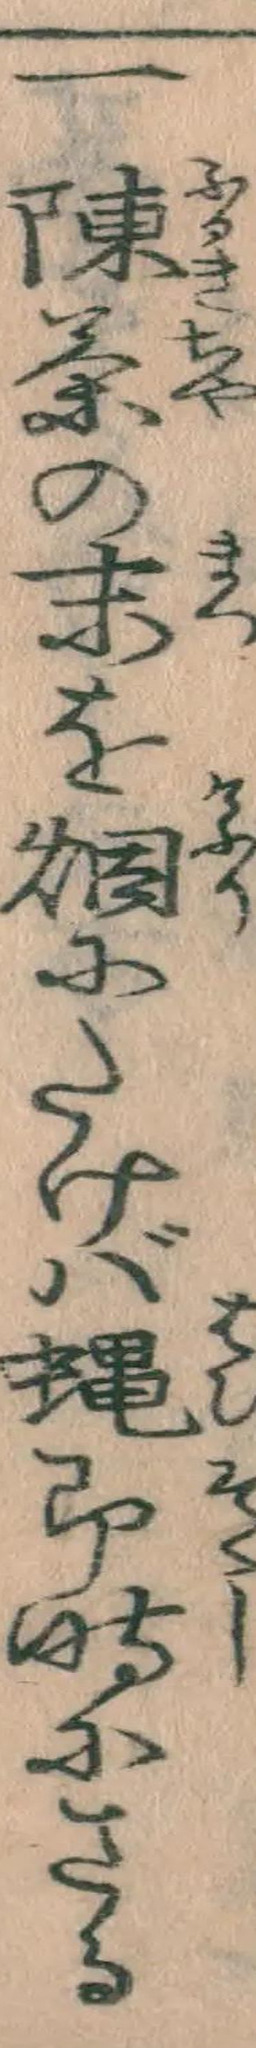一陳茶の末を煙にたけば蝿即時にさる
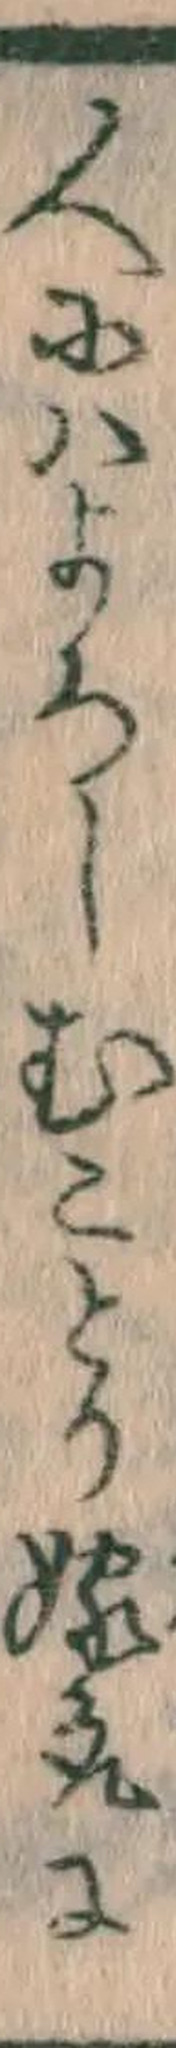人にはよろしむことり嫁取に
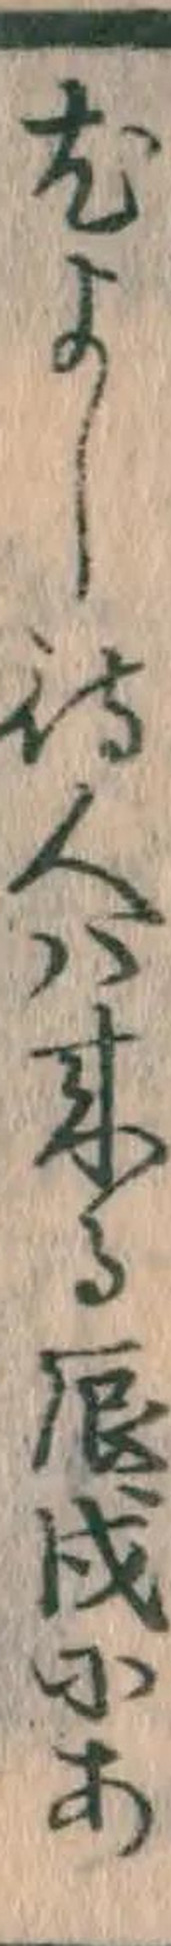尤よし待人は来る辰戌にあ
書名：広益秘事大全 3巻. [1]
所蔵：国立国会図書館 National Diet Library, JAPAN
